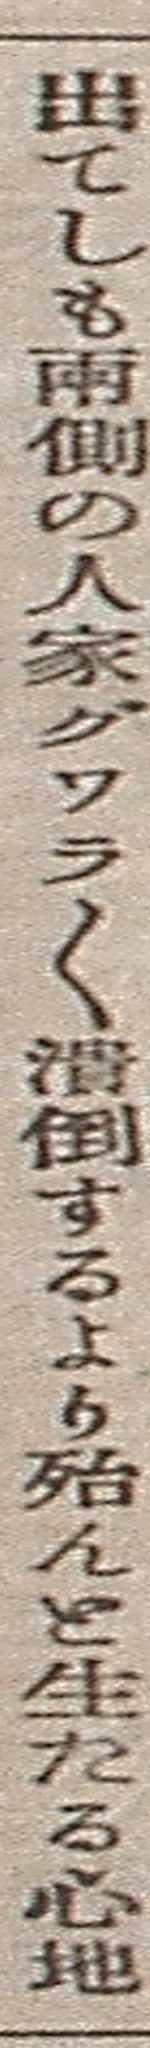出てしも両側の人家グワラ〳〵潰倒するより殆んど生たる心地

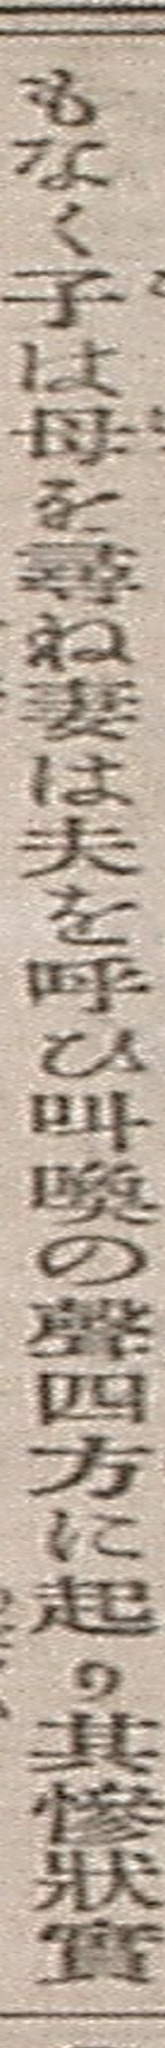もなく子は母を尋ね妻は夫を呼ひ叫喚の声四方に起り其惨状実
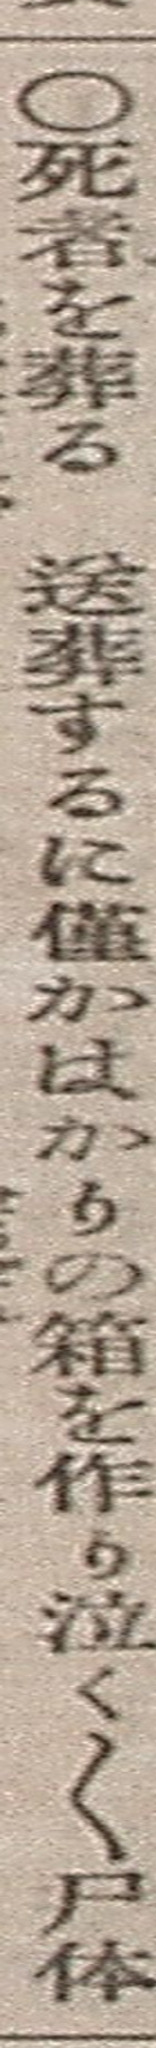〇死者を葬る送葬するに僅かはかりの箱を作り泣く〳〵尸体
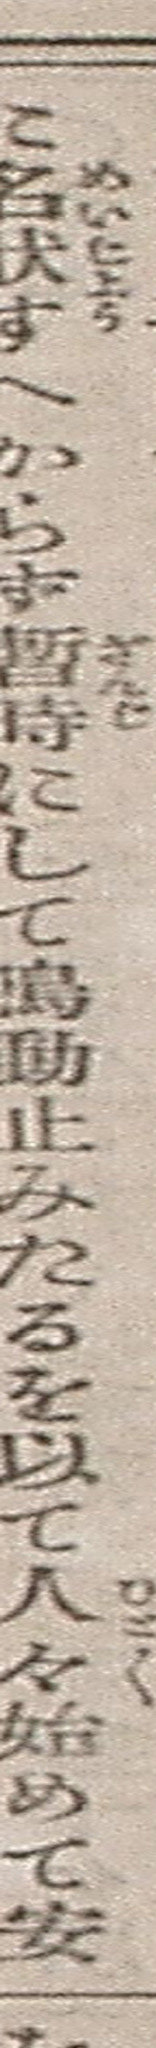に名状すへからず暫時にして鳴動止みたるを以て人々始めて安
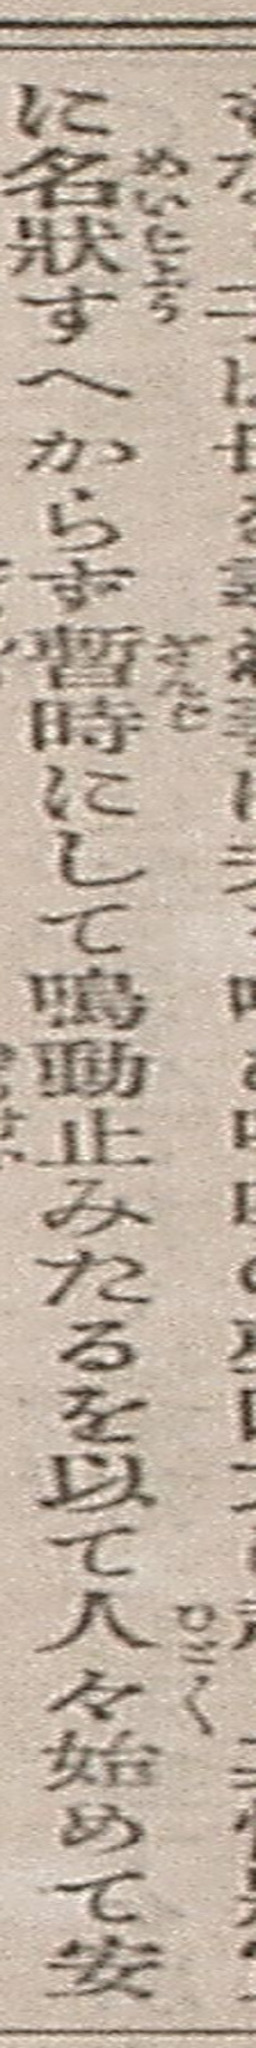に名状すへからず暫時にして鳴動止みたるを以て人々始めて安
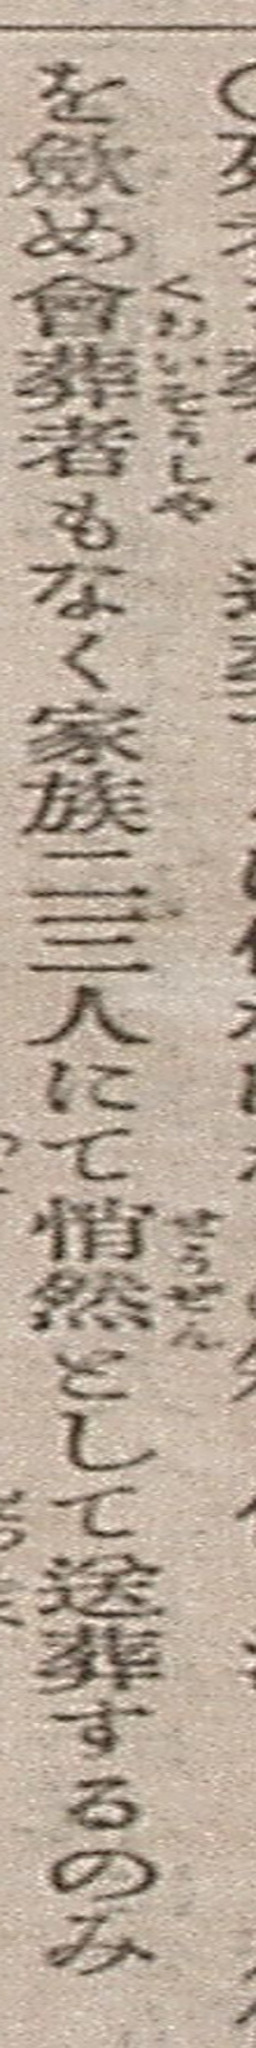を歛め会葬者もなく家族二三人にて悄然として送葬するのみ
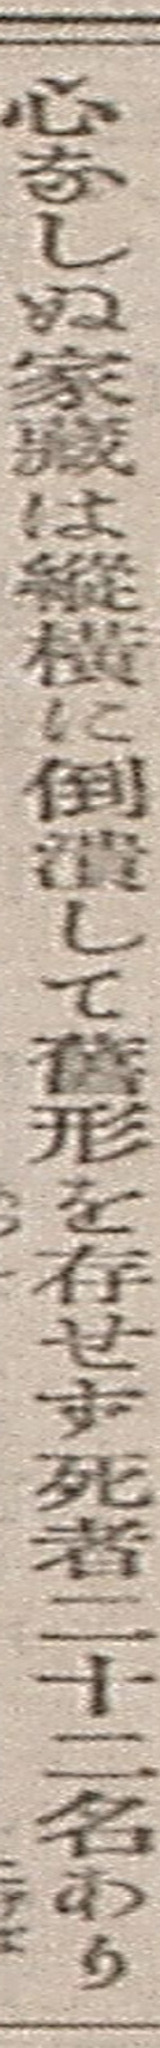心なしぬ家蔵は縦横に倒潰して旧形を存せず死者二十二名あり
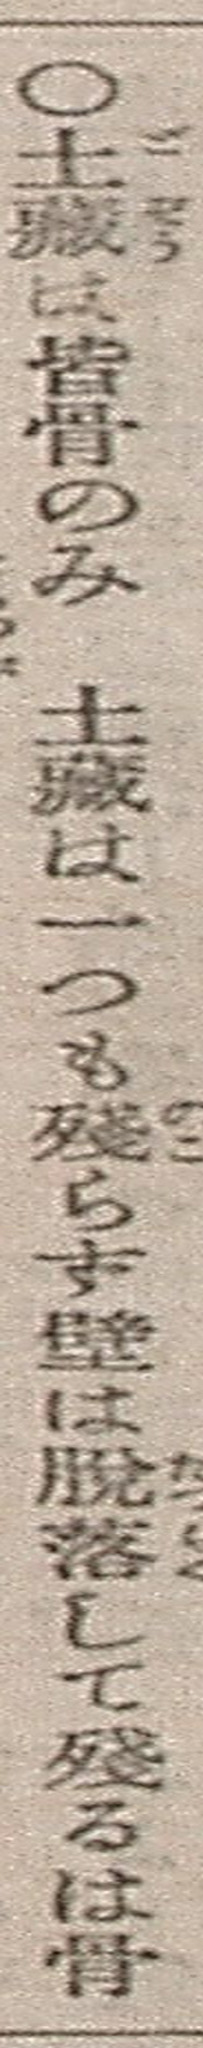〇土蔵は皆骨のみ土蔵は一つも残らず壁は脱落して残るは骨
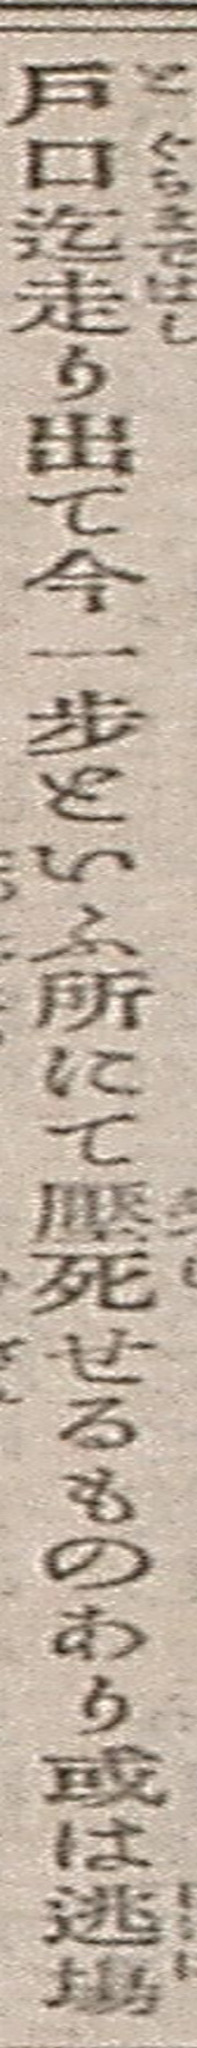戸口迄走り出て今一歩といふ所にて圧死せるものあり或は逃場
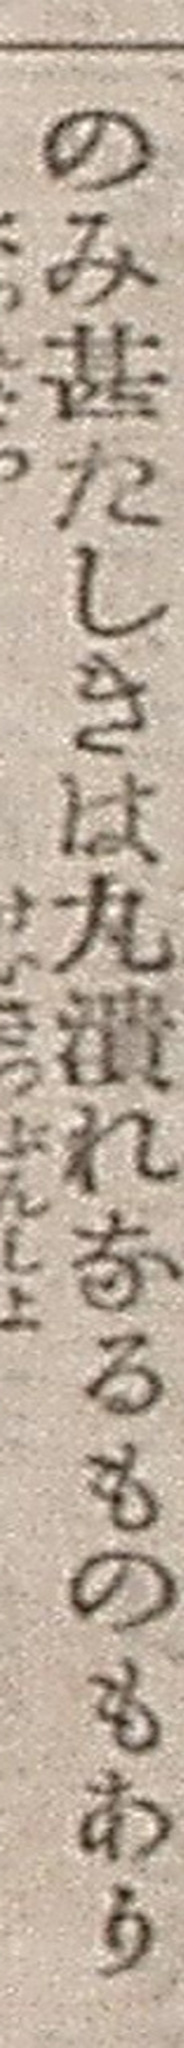のみ甚たしきは丸潰れなるものもあり
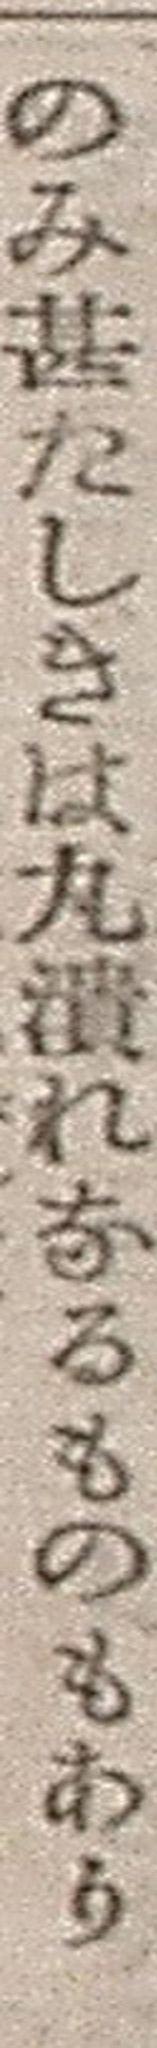のみ甚たしきは丸潰れなるものもあり
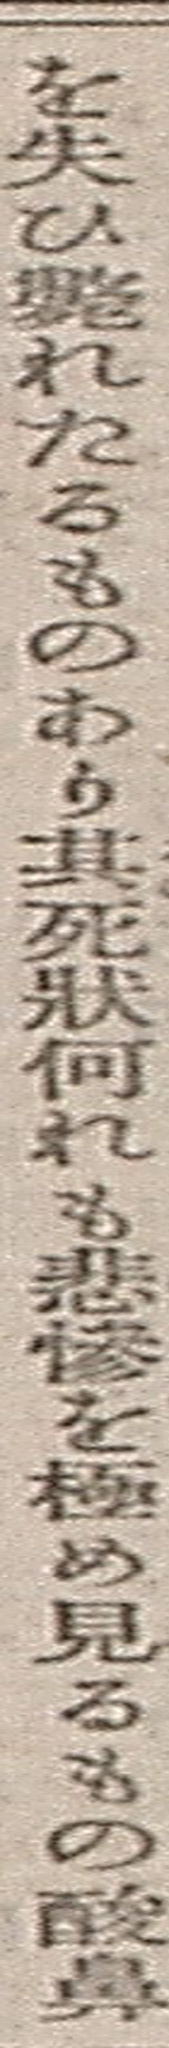を失ひ斃れたるものあり其死状何れも悲惨を極め見るもの酸鼻
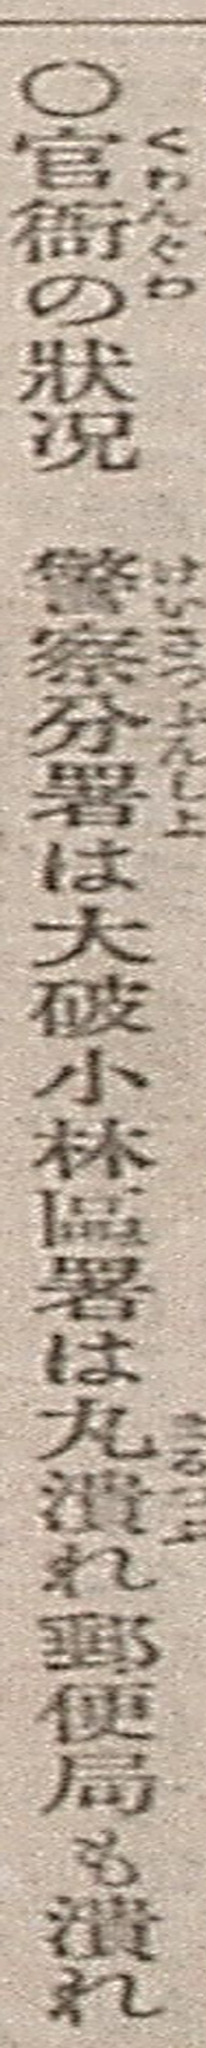〇官衙の状況警察分署は大破小林区署は丸潰れ郵便局も潰れ
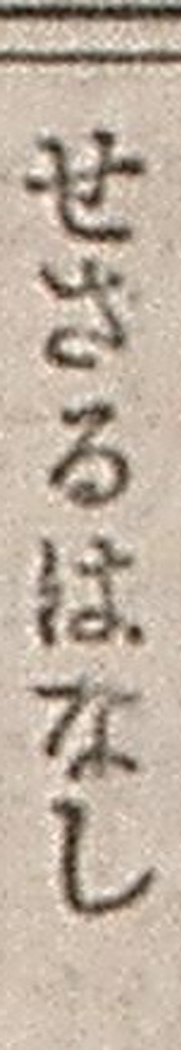せさるはなし
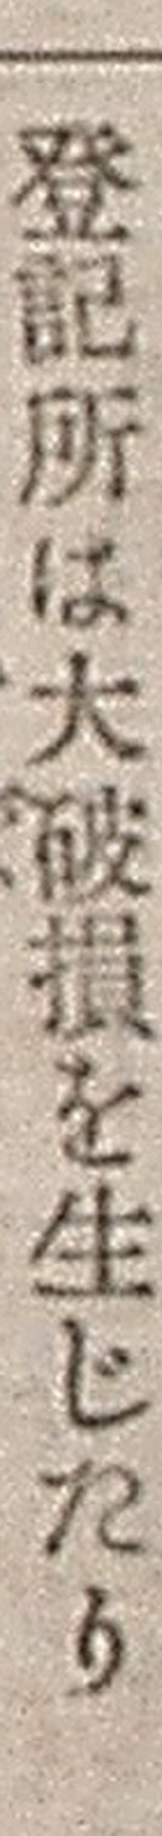登記所は大破損を生じたり
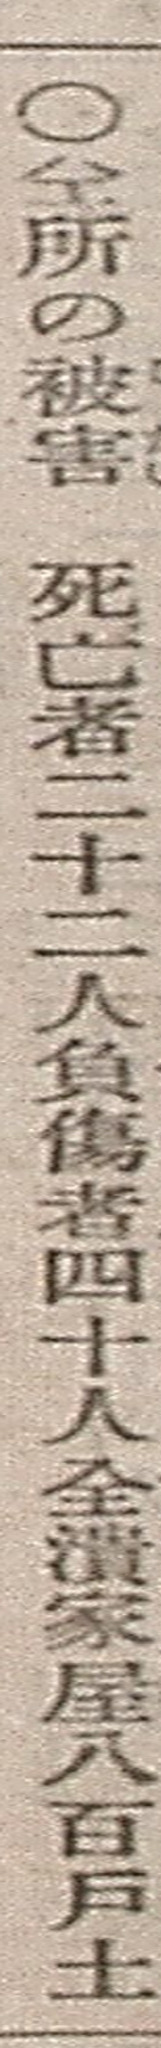〇仝所の被害死亡者二十二人負傷者四十人全潰家屋八百戸土
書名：風俗畫報臨時増刊第百二十四號　洪水地震被害録（上）
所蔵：東京大学地震研究所図書室 Earthquake Research Institute Library, The University of Tokyo, JAPAN
